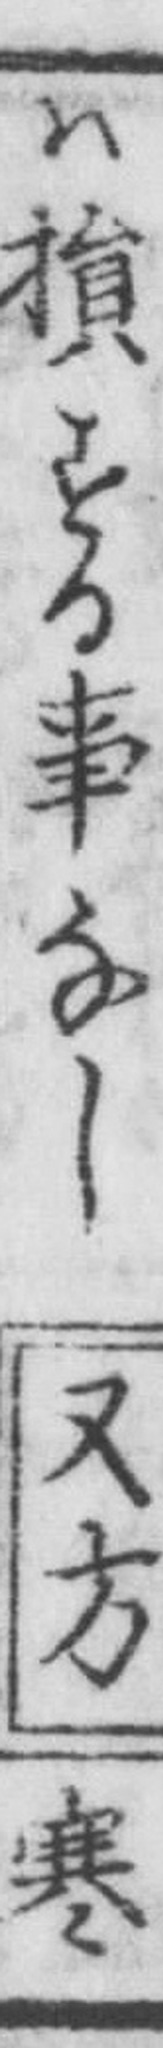ハ損する事なし又方寒
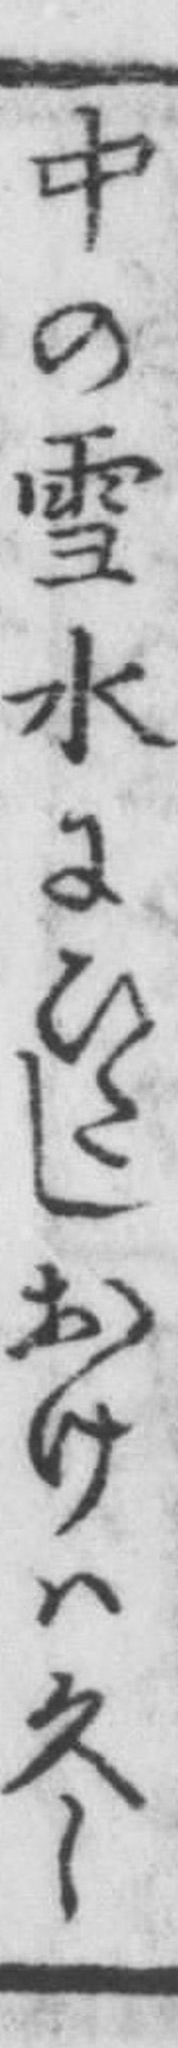中の雪水にひたしおけハ久し
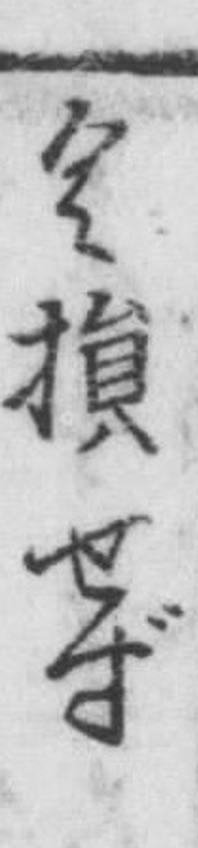く損せず
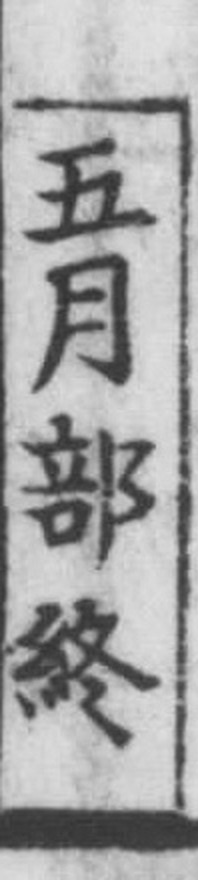五月部終
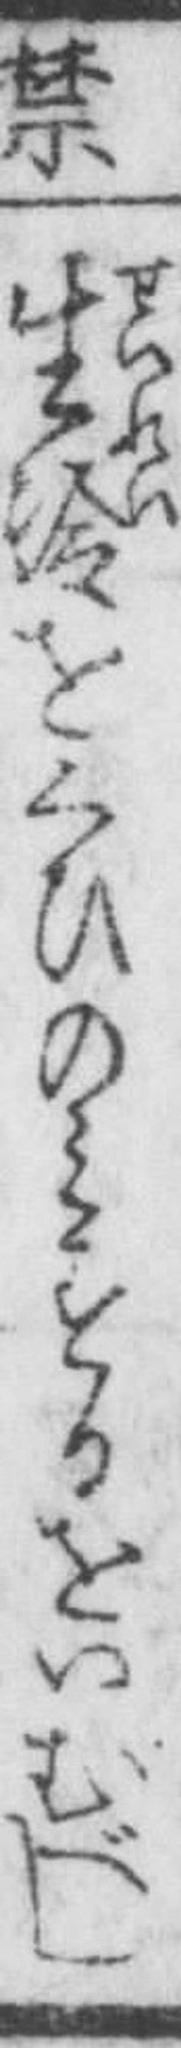禁生冷をくひのミをるをいむべし
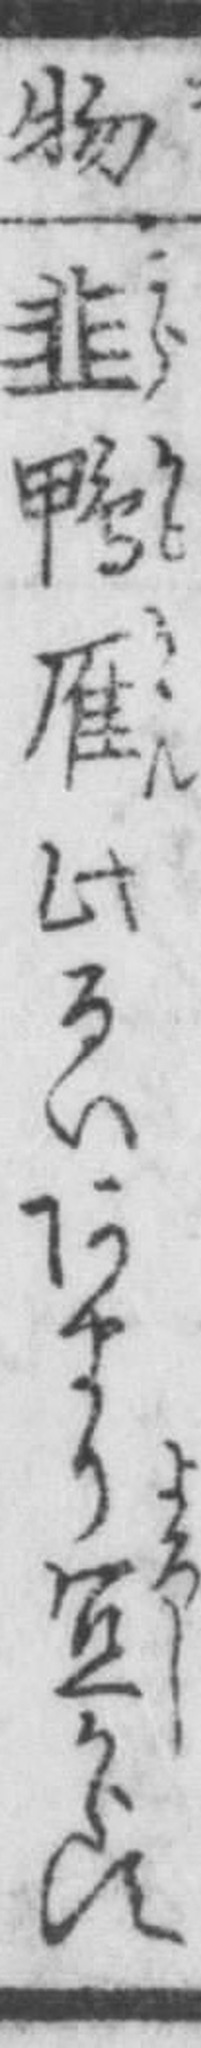物韭鴨雁此のるい何より宜からず
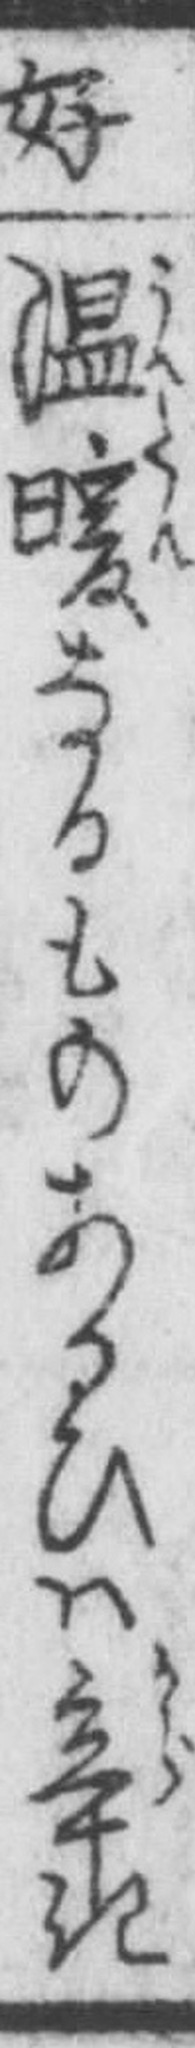好温暖なるものあるひハ辛き
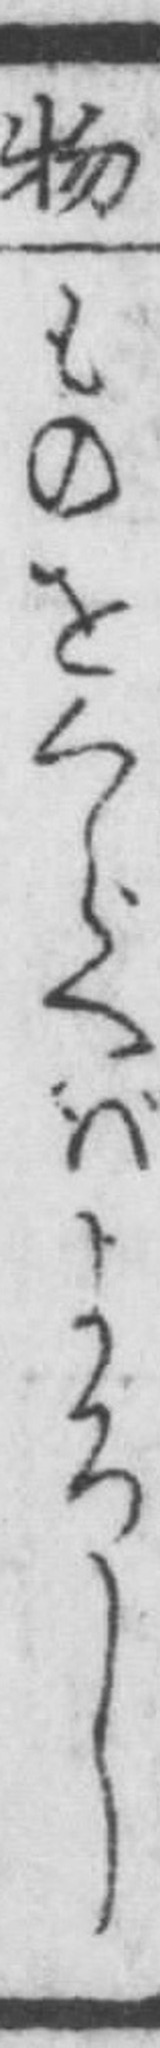物ものをくらへバよろし
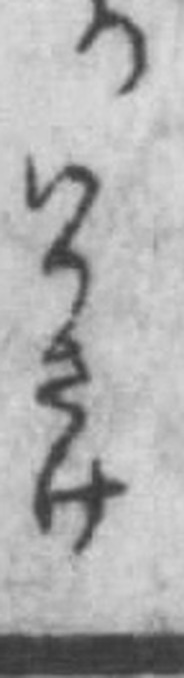いりさけ

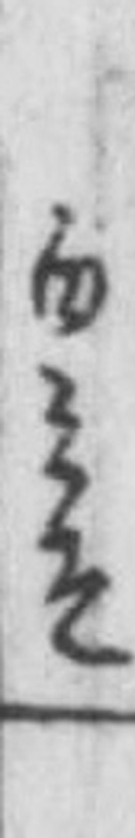白ミそ
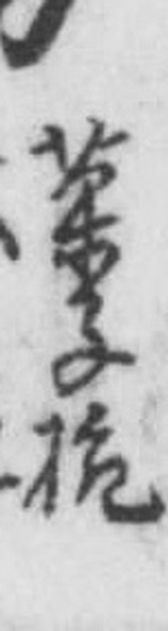菓子椀
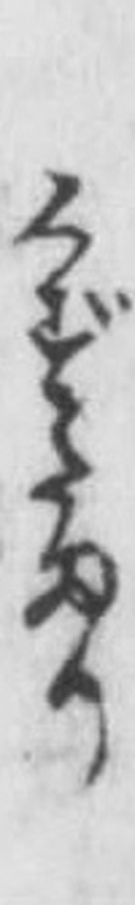くずたまり
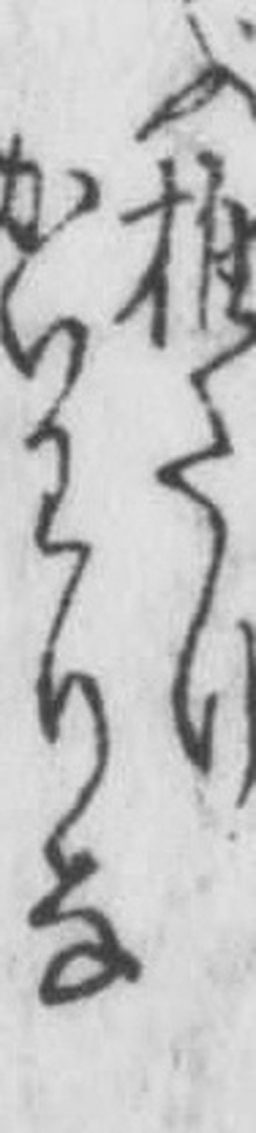かいわりな
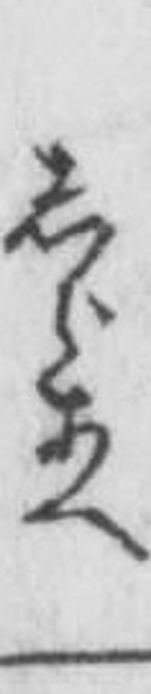しらあへ
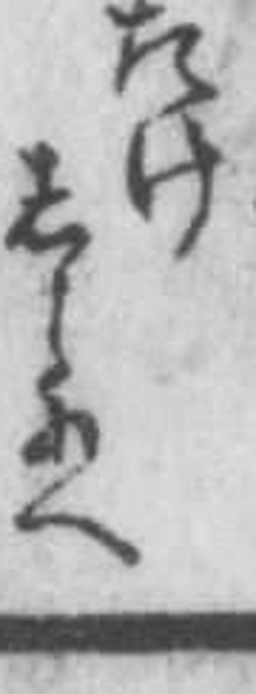しらあへ
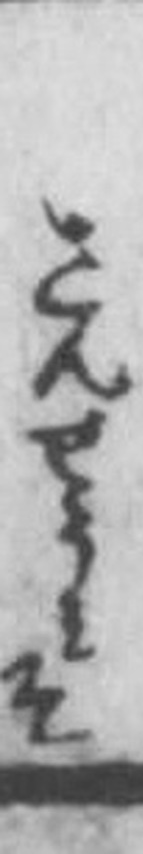さんせうミそ
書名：当世料理筌
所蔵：大阪府立大学学術情報センター 国文学研究資料館
